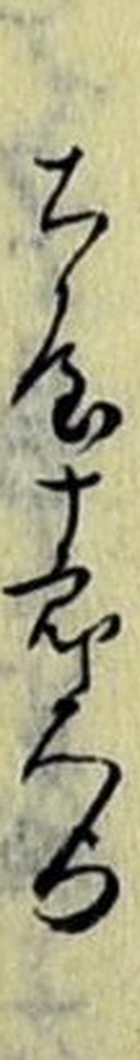土屋十郎右衛門
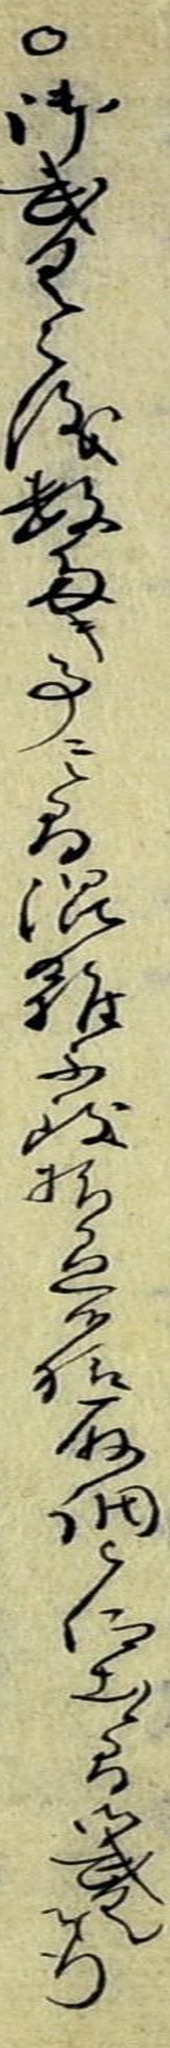〇御武具之儀数多キ事ニ候間混雑不致指置候様取調被仰出候間御武具奉行
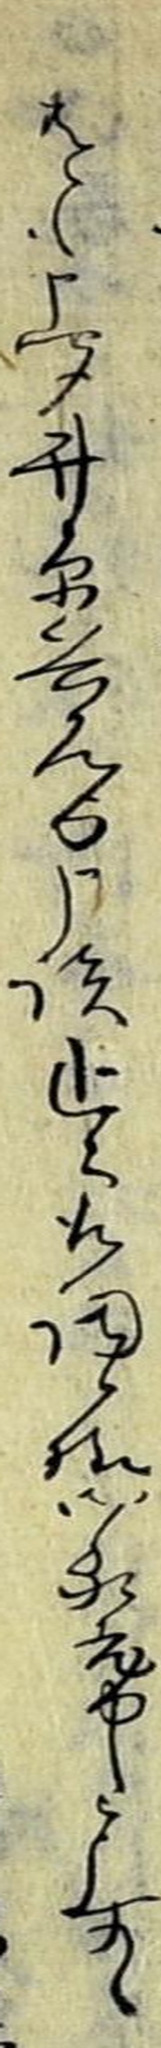共へも申聞井原兵左衛門申談追々取調候様御家老中被申聞候
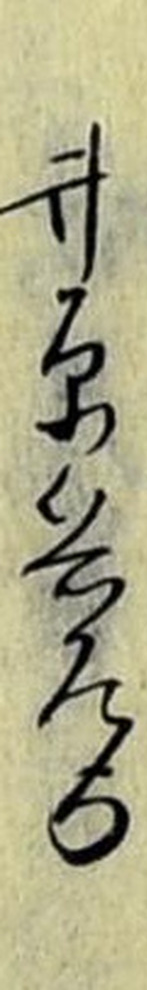井原兵左衛門
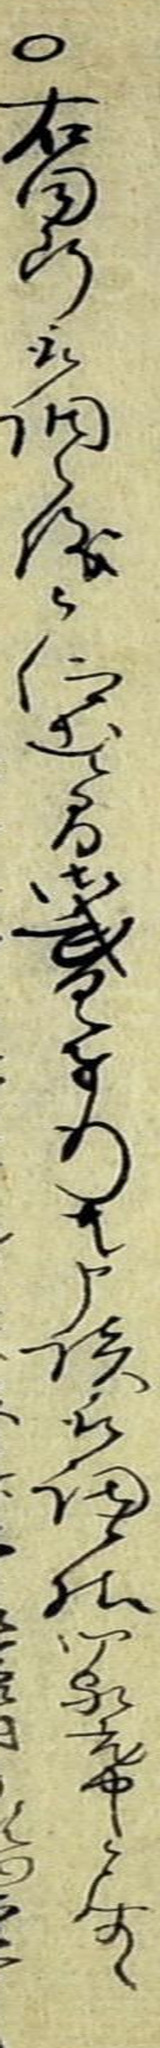〇右同断取調之儀被仰出候間御武具奉行共申談取調候様御家老中被申聞候
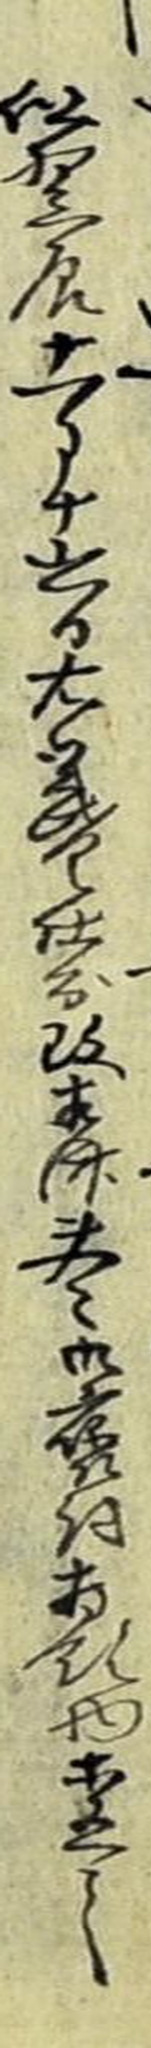二月廿五日但翌辰十一月十六日右御武具仕分改相済夫々御褒詞拝領物等有之
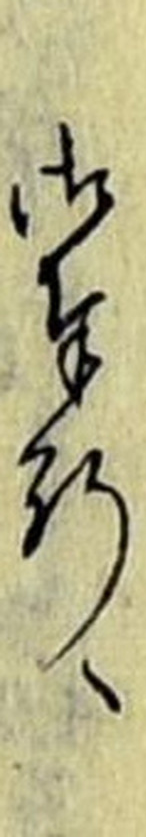御奉行へ
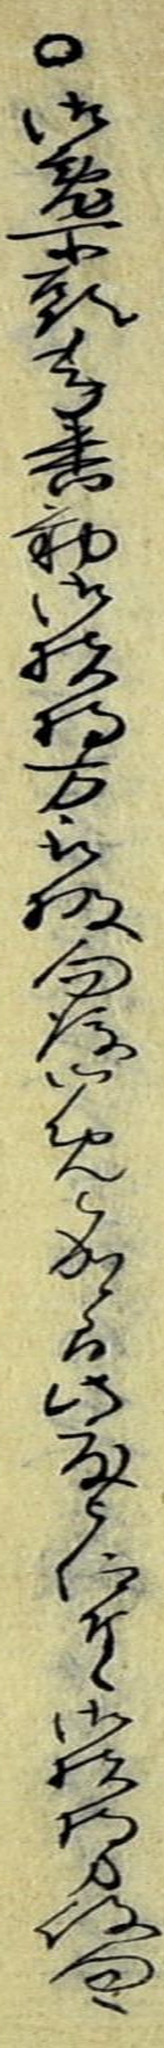〇御台所頭年番勤御指物方取扱向後御免被成候間此度被仰付候御指物方役向へ

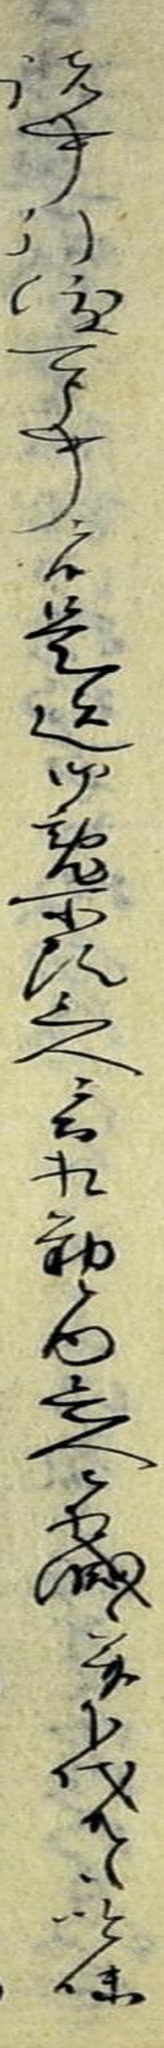諸事引渡可申事ニ候是迄御台所頭三人ニ而相勤候内壱人被相減候并下代共も吟味
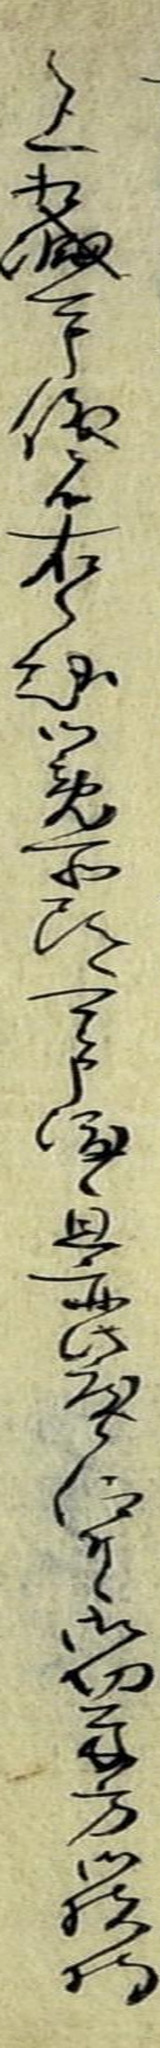之上相減可申儀ニ候右之趣御台所頭へ可被申渡候且亦此度被仰付候御切米方御指物
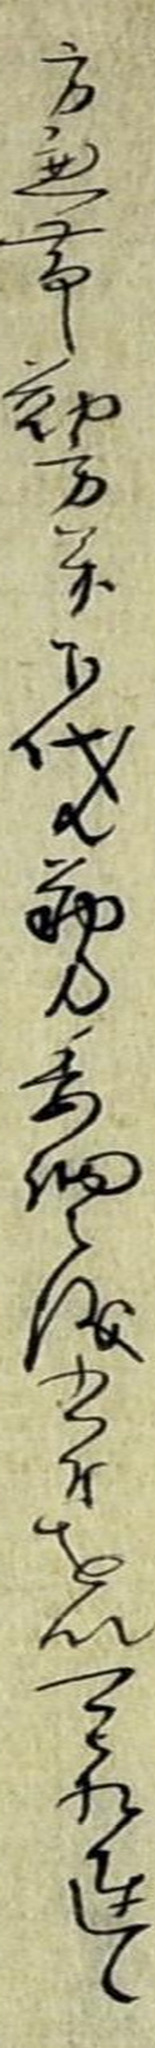方兼帯勤方并下代共勤方委細之儀書付を以可被相達候
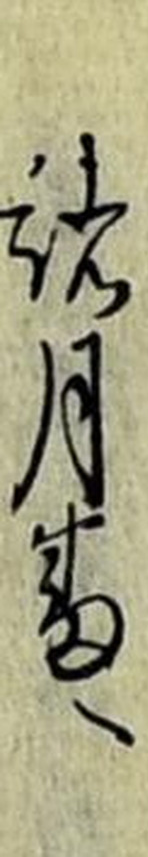諸月番へ
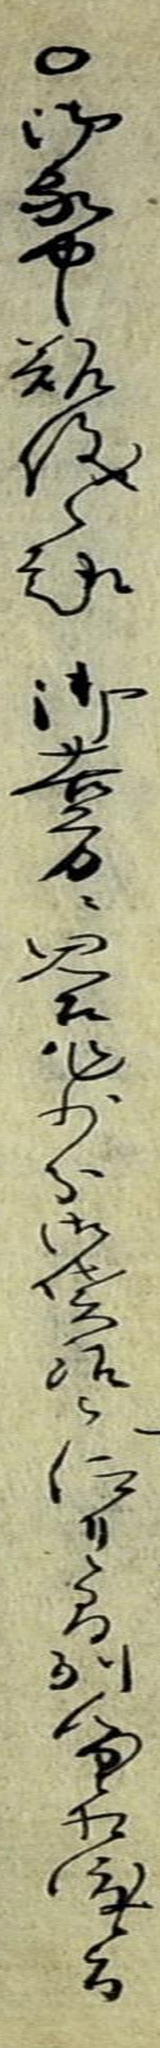〇御家中難儀之趣御苦労ニ思召乍少分御貸銀被仰付候間別紙相渡候旨
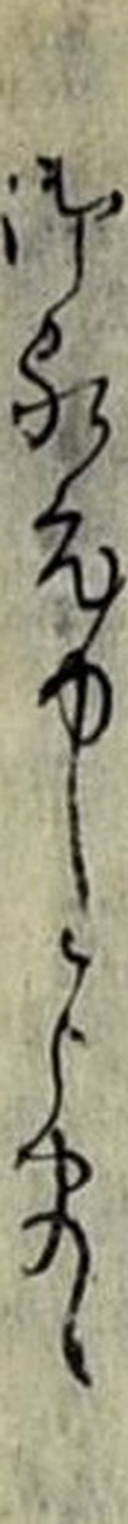御家老中被申聞候
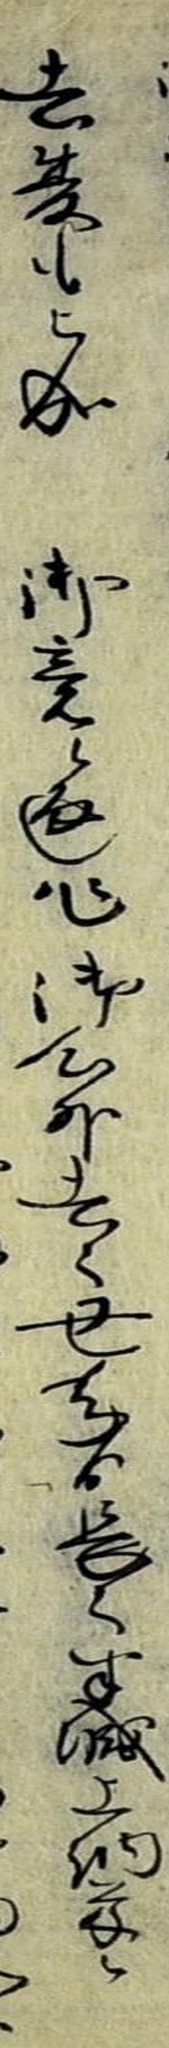去夏も被成御意候通乍御心外去々丑年ゟ長々半減上納米被
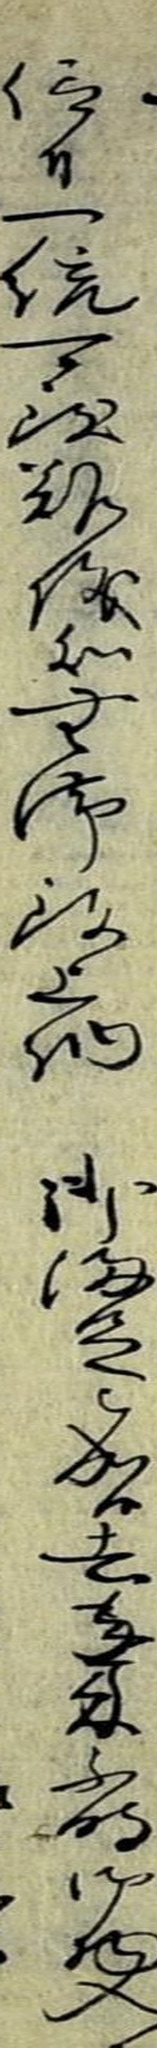仰付一統可致難儀処無滞致上納御満足被成候去年来不時御物入等
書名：命令之部 三
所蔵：福井県文書館 Fukui Prefectural Archives
